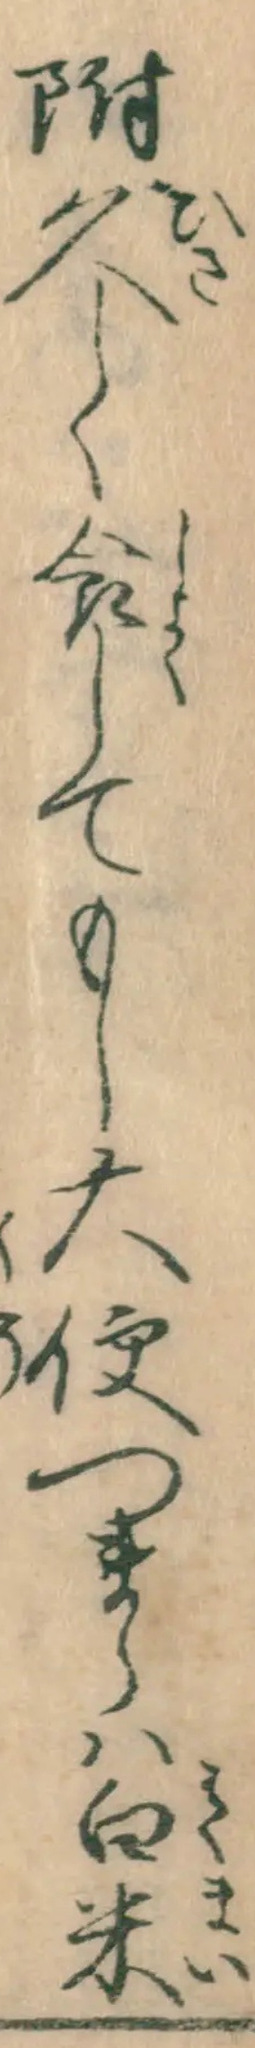附久しく食してもし大便つまらは白米
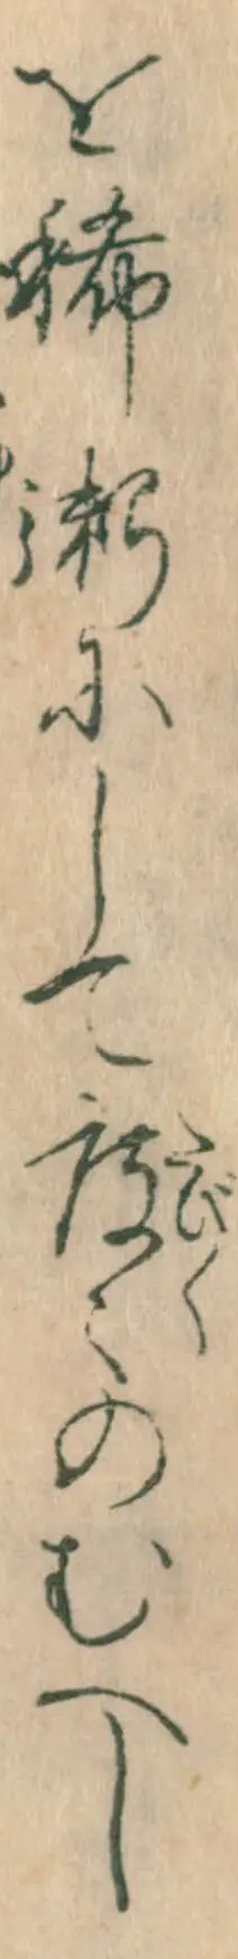を稀粥にして度々のむへし泄瀉
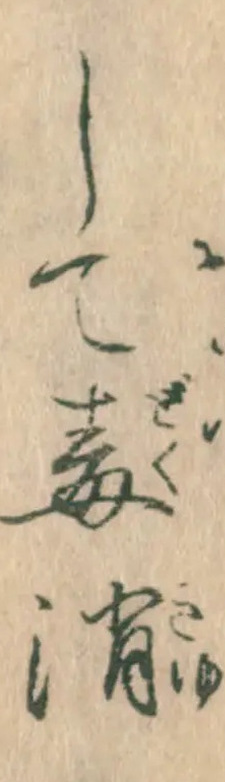して毒消
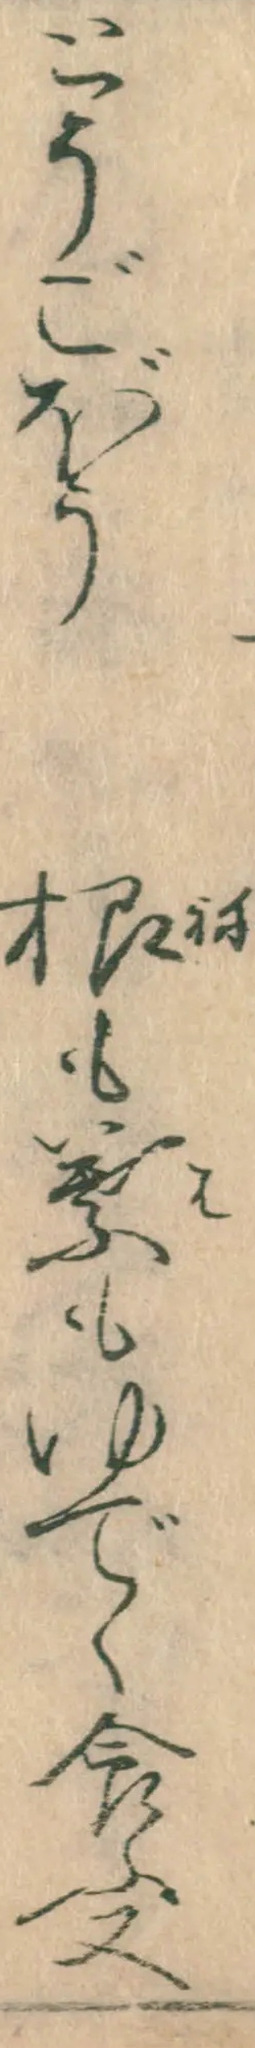とうごぼう根も葉もゆでゝ食ふ又
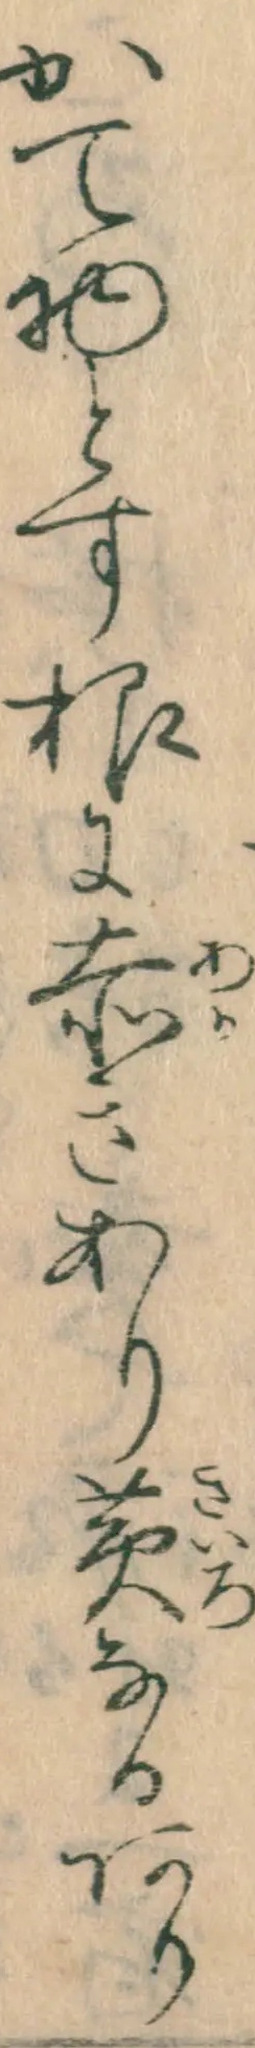かて物とす根に赤きあり黄なるあり
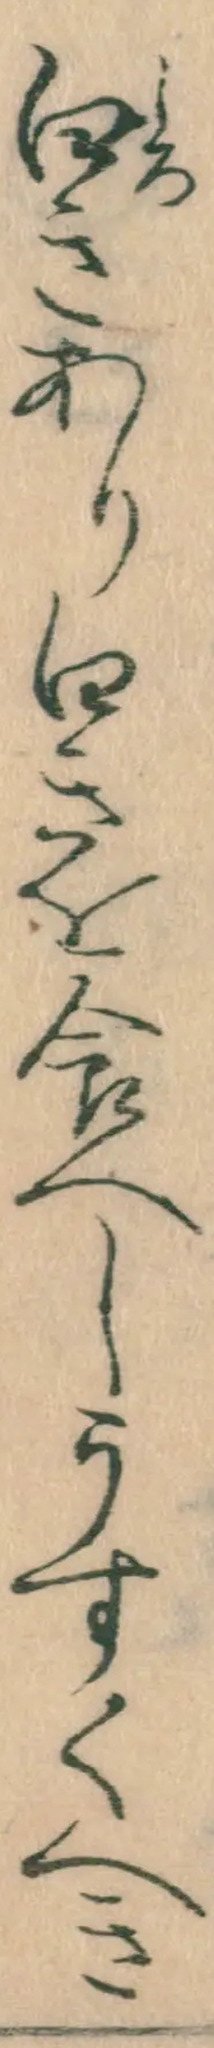白きあり白きを食へしうすくへき
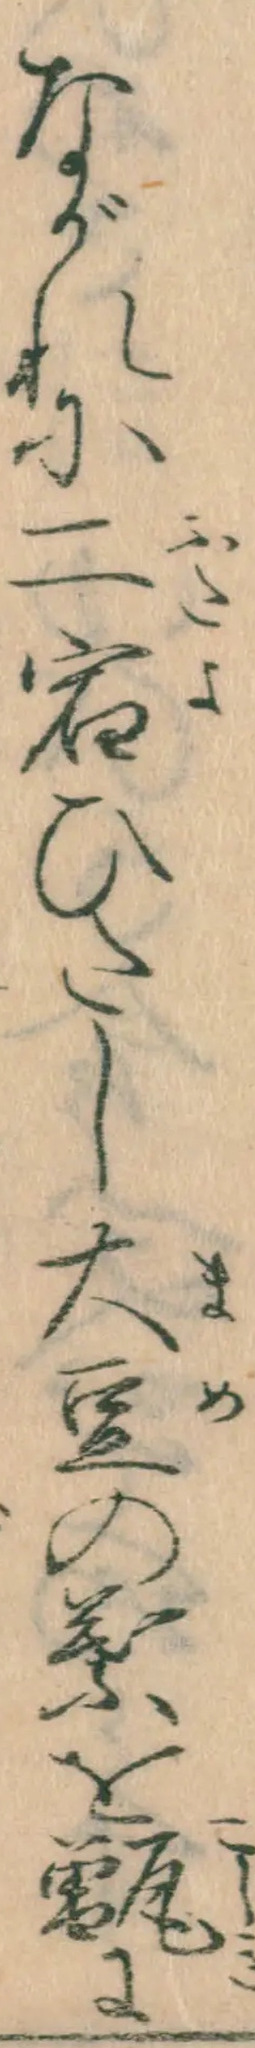ながれに二宿ひたし大豆の葉を甑に
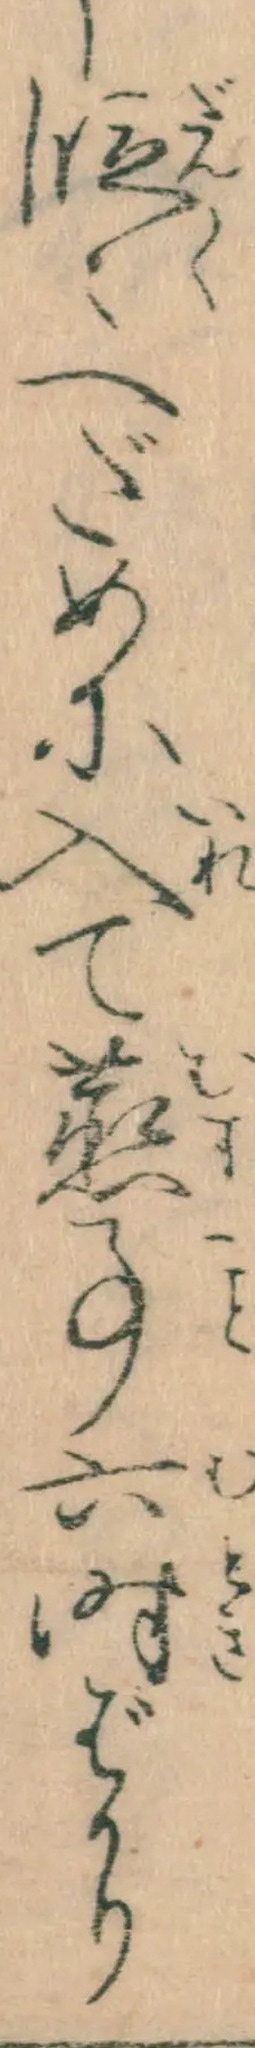し段々へだめに入て蒸事六時ばかり
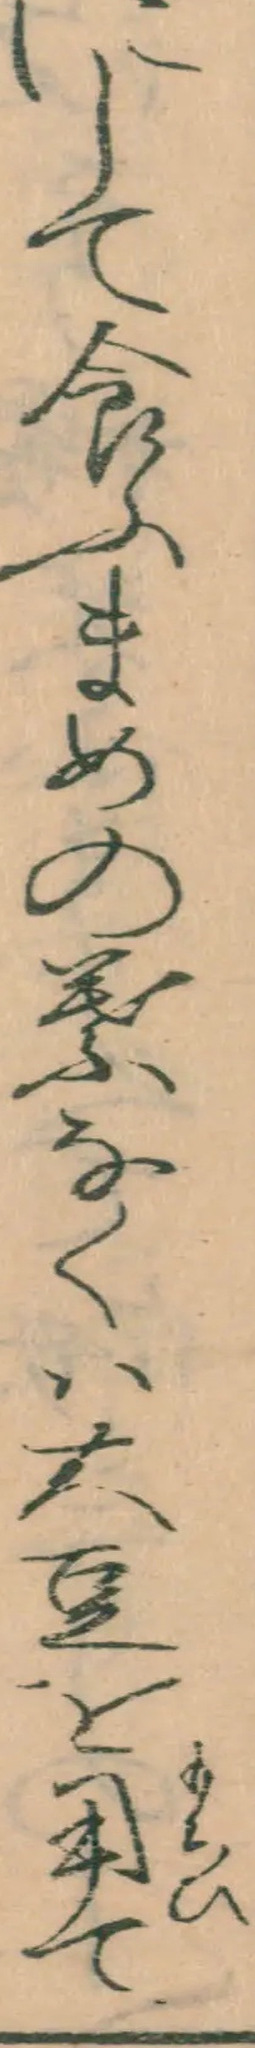にして食ふまめの葉なくは大豆を用て
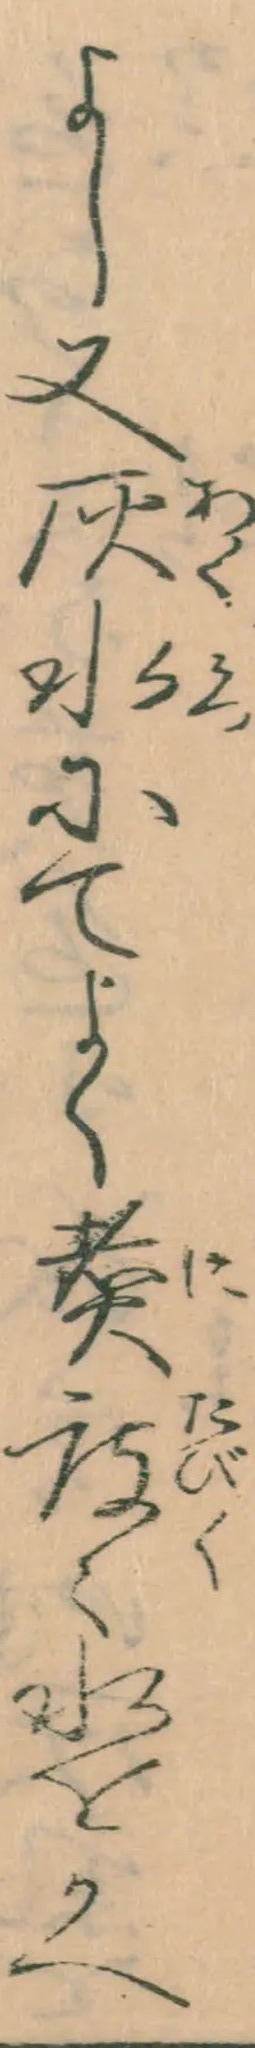よし又灰水にてよく煮度々水をかへ
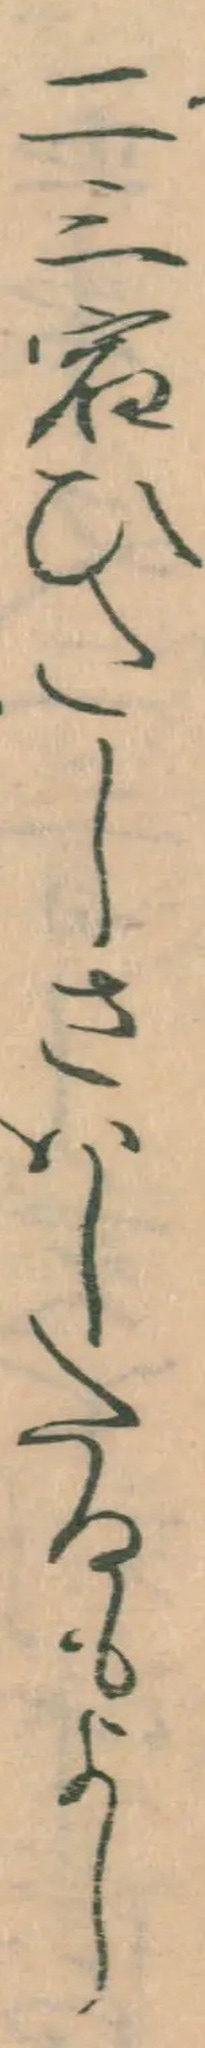二三宿ひたしさはしたるもよし
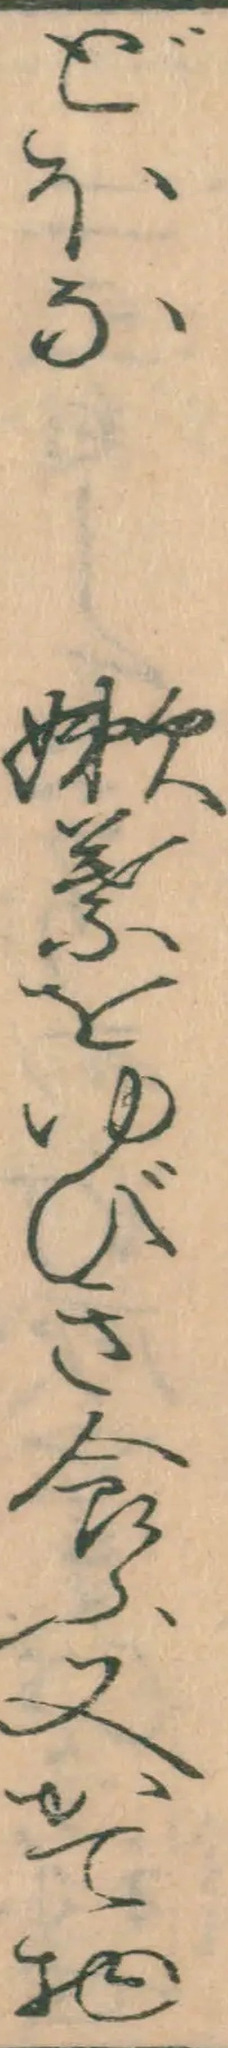どほな嫰葉をゆびき食ふ又かて物
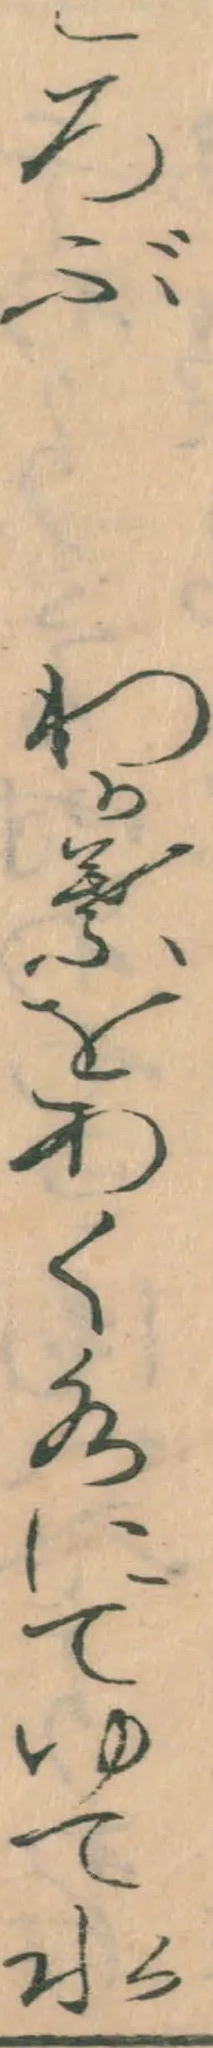どろぶわか葉をあく水にてゆて水
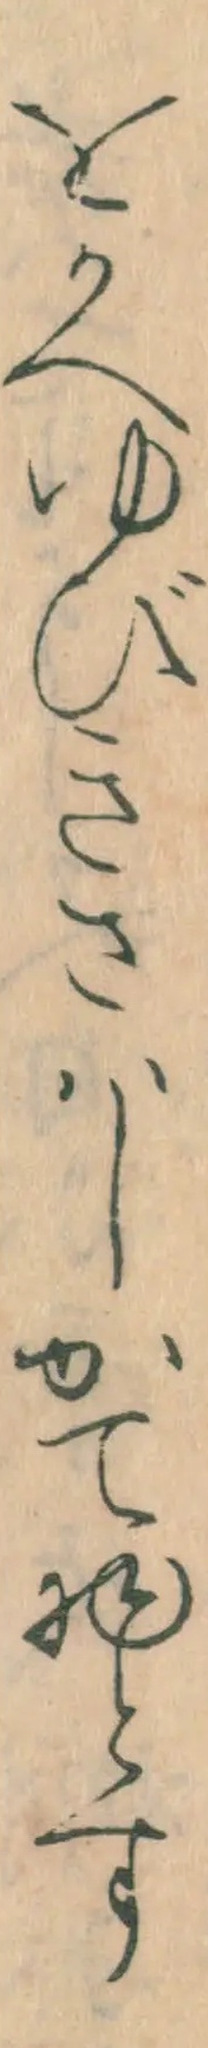をかへゆびきさはしかて物とす
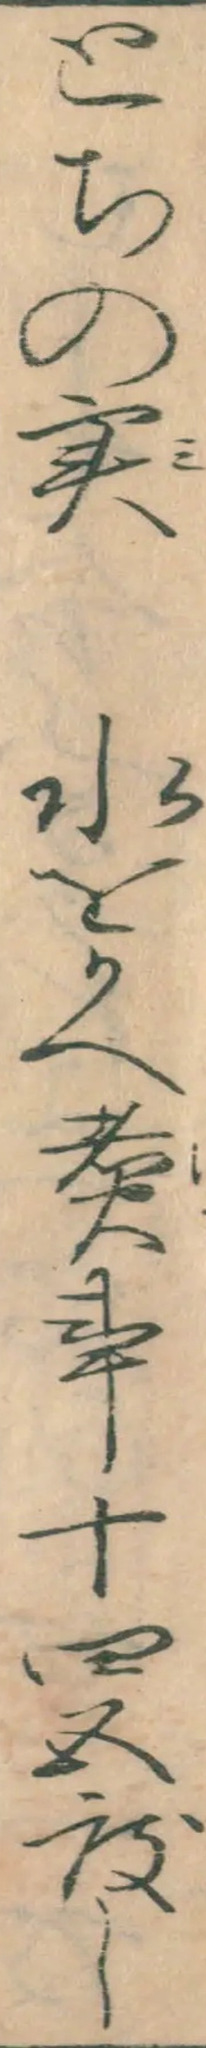とちの実水をかへ煮事十四五度し

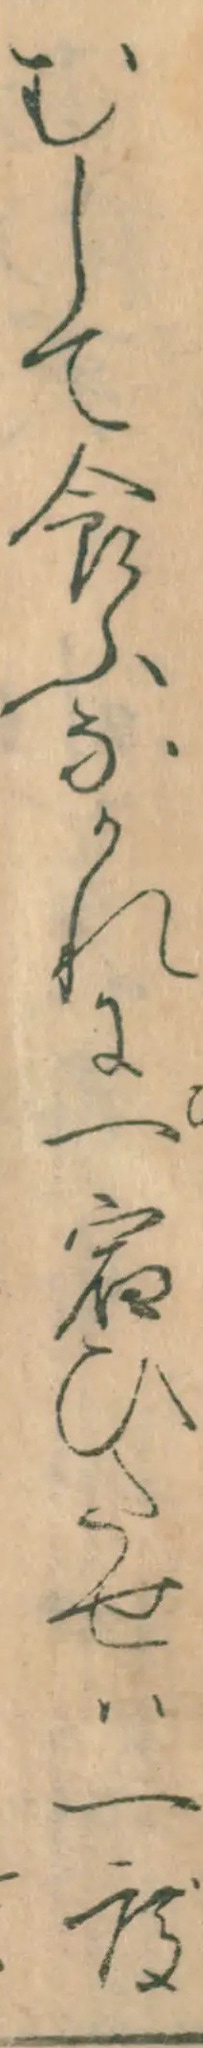むして食ふなかれに一宿ひたせは一度
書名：かてもの
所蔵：国立国会図書館 National Diet Library, JAPAN
